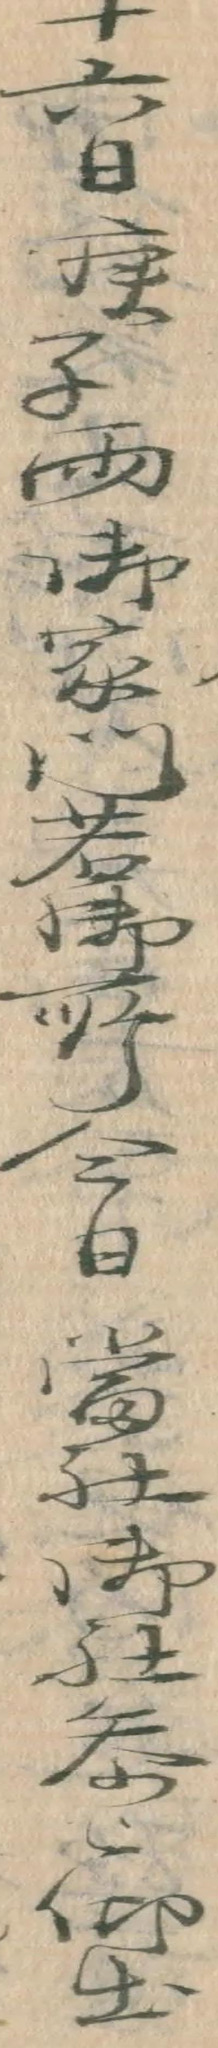十六日庚子雨御家門若御所今日當社御社参被仰出
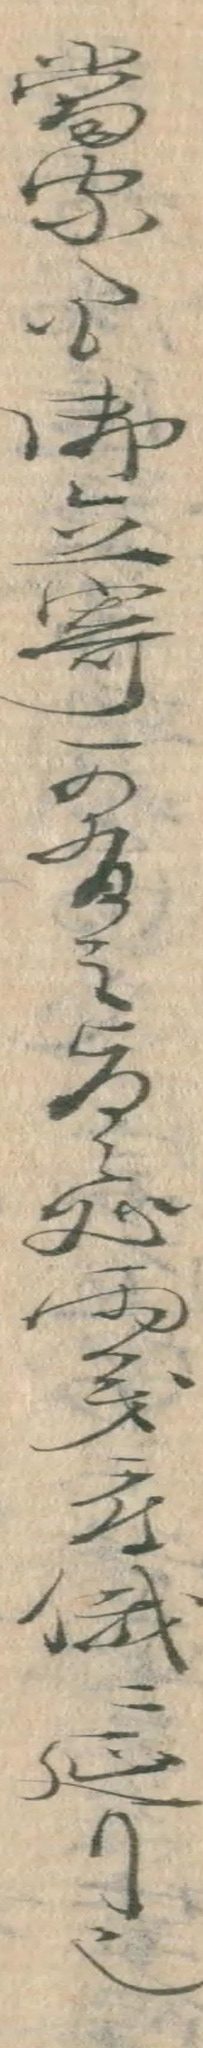當家へも御立寄可有之旨之處雨義ニ付俄ニ延引也
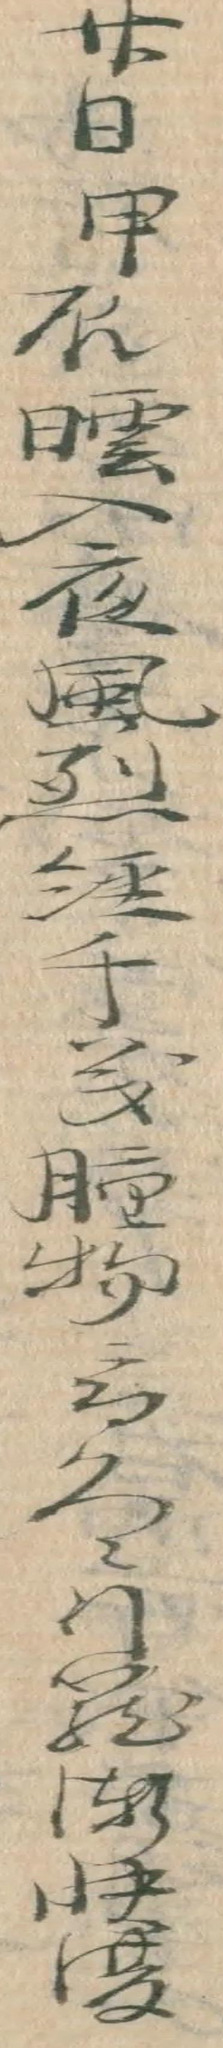廿日甲辰曇入夜風烈経千義腫物ニ而久ニ引籠漸快復
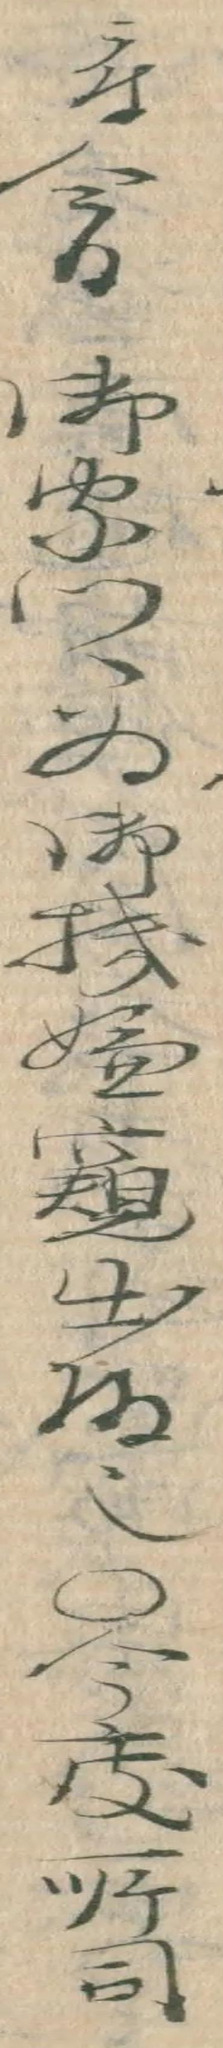ニ付今日御家門ヘ為御機嫌窺出帰也○今度所司
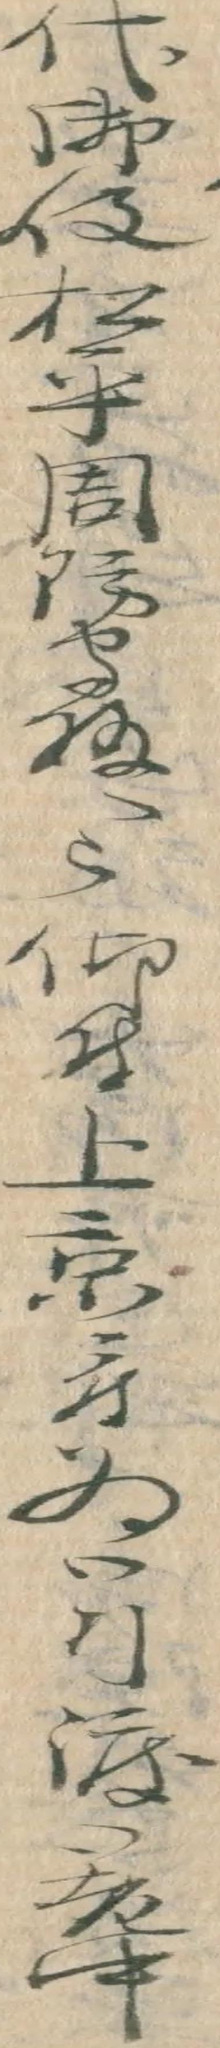代御役松平周防守殿へ被仰付上京ニ付為御引渡御老中
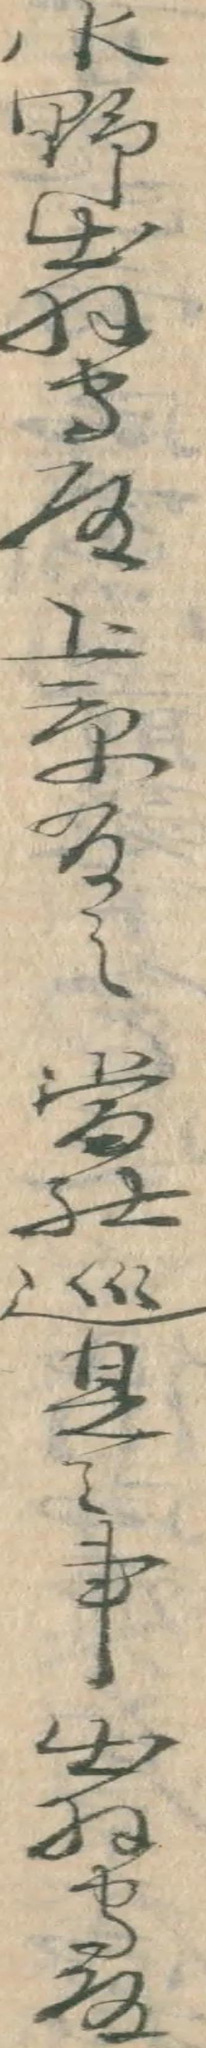水野出羽守殿上京有之當社巡見之事出羽寺殿
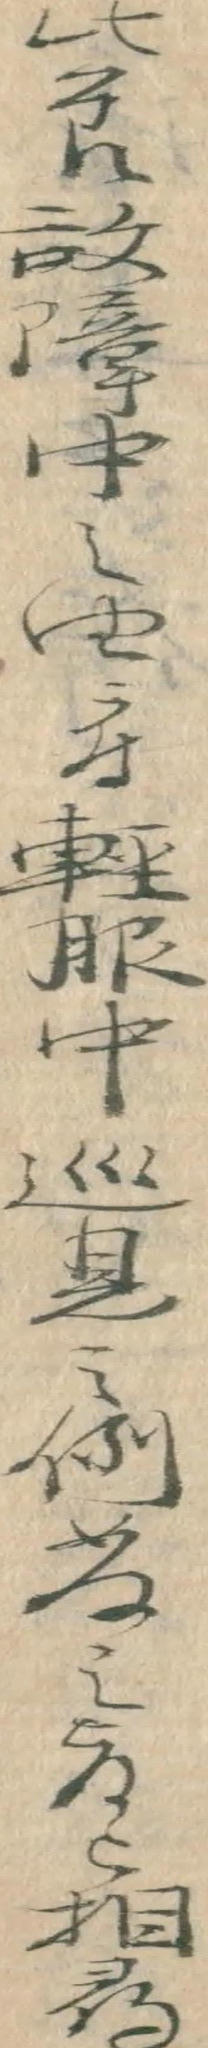比節故障中之由ニ付軽服中巡見之例如何之旨被相尋
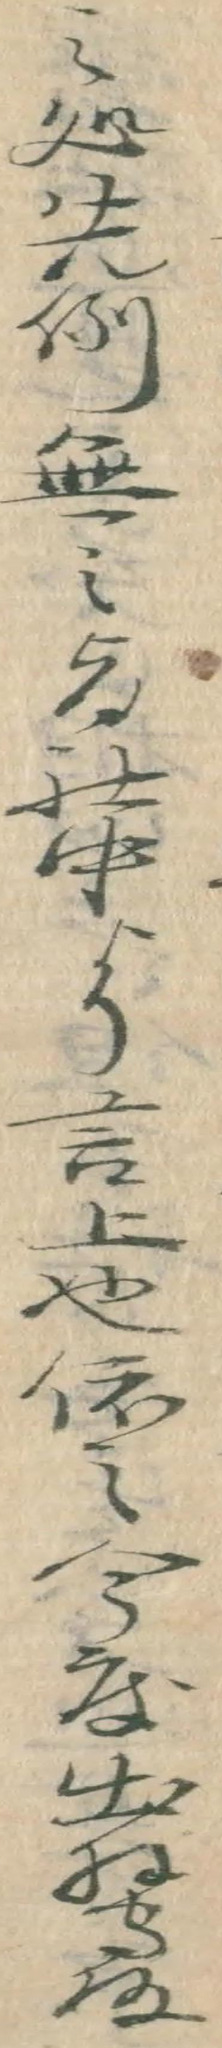之処先例無之旨社中より言上也依之今度出羽守殿

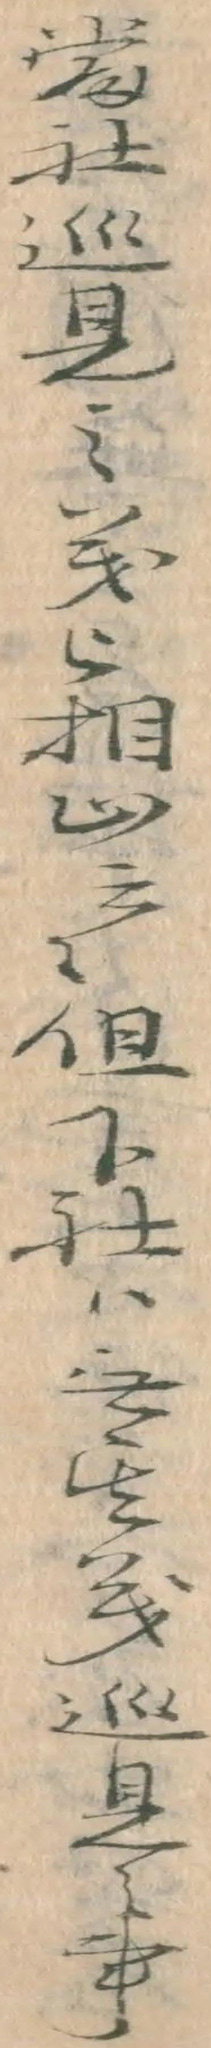當社巡見之義被相止云〻但下社ハ無其義巡見候事
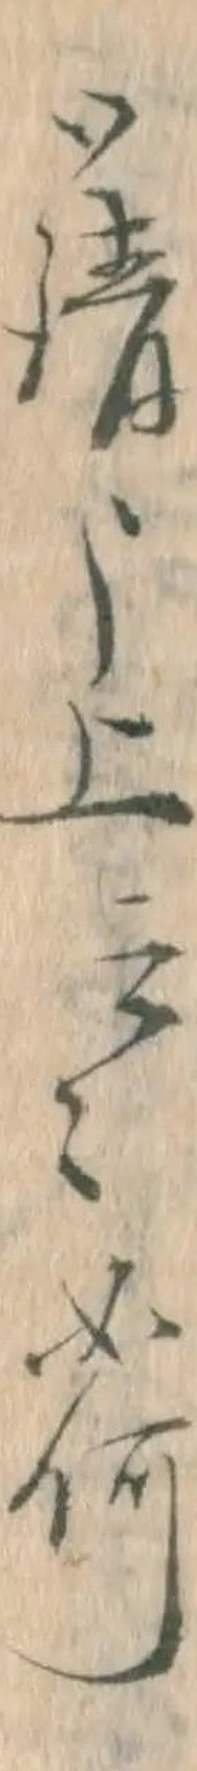御請申上云々如何
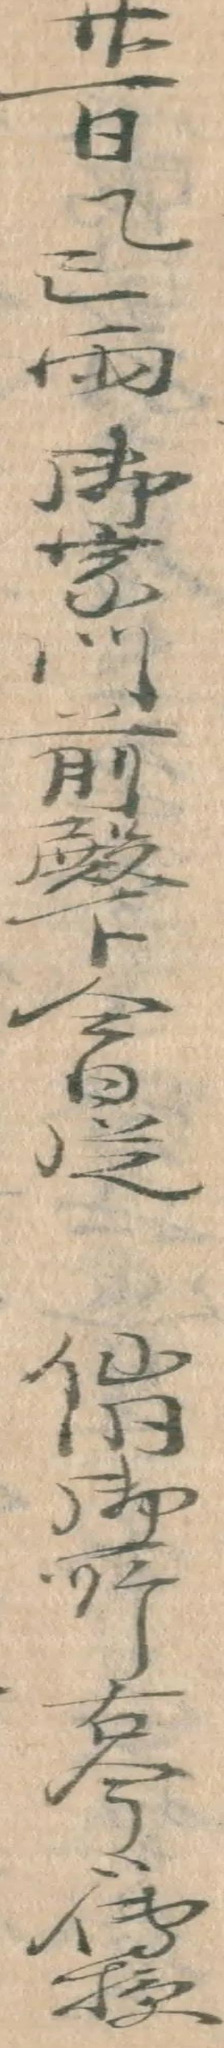廿一日乙巳雨御家門前殿下今日従仙洞御所古今御傳授
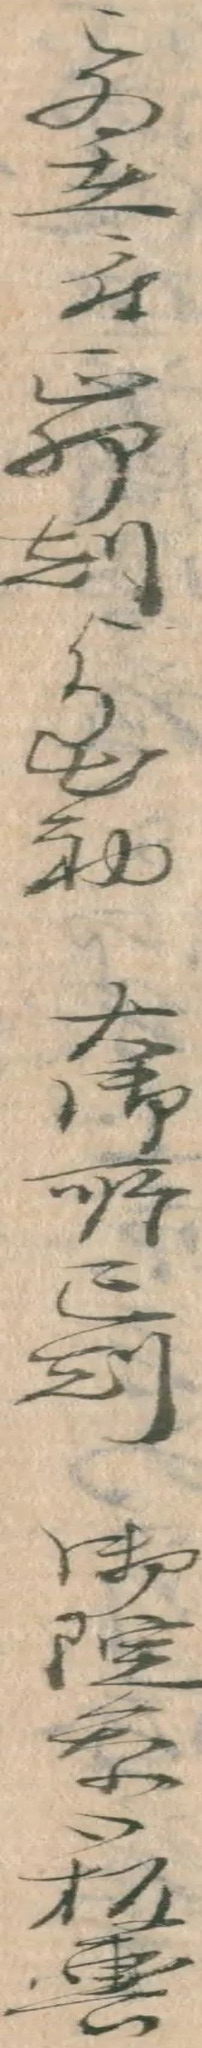被為在ニ付正卯刻より出勤大御所巳刻御院参御板輿
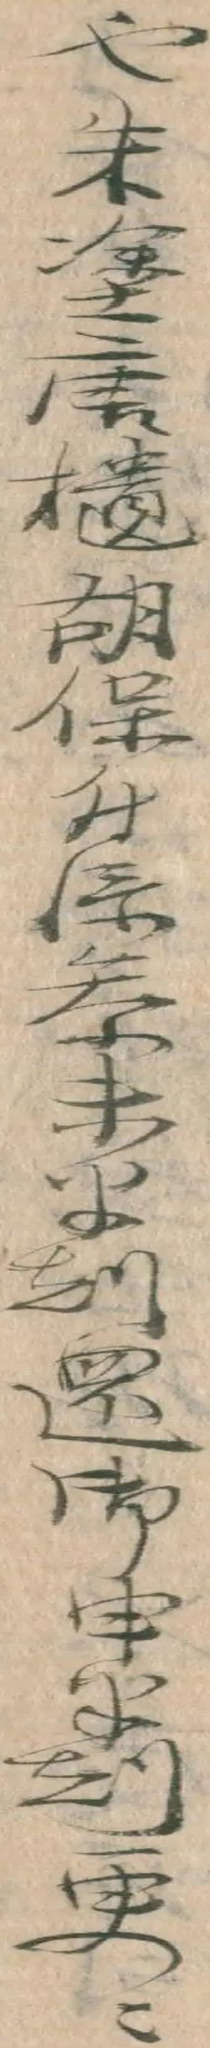也朱塗唐櫃胡保付添参未半刻還御申半刻更ニ
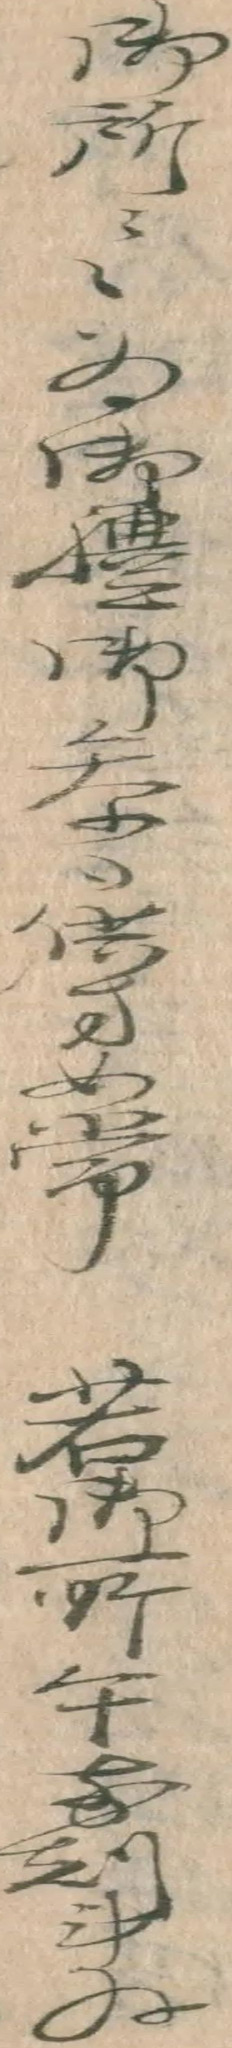御所々々為御禮御参御供方如常若御所午前刻斗為
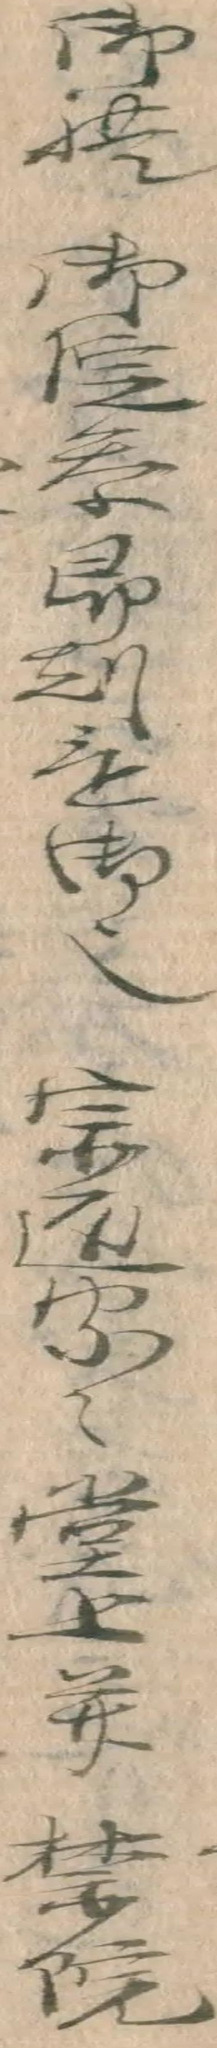御禮御院参即刻還御也宗匠家之堂上并禁院
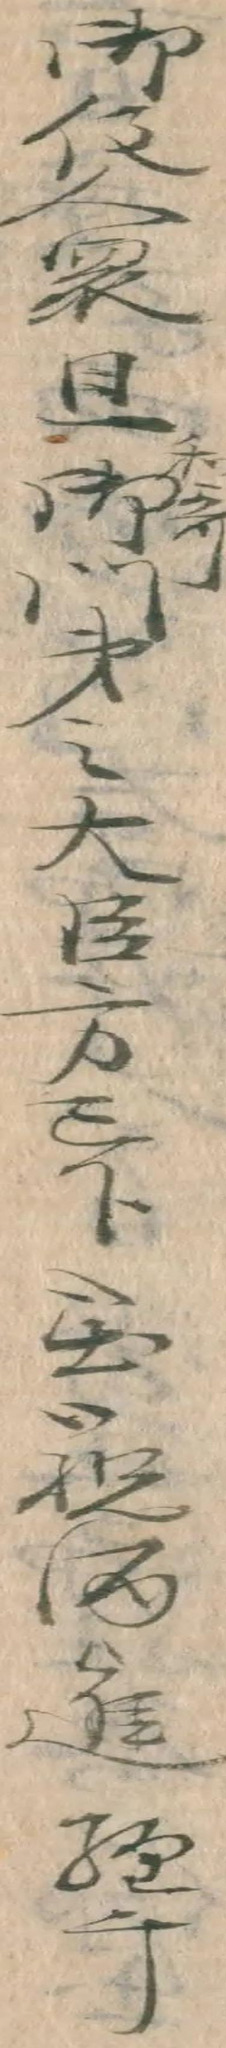御役人衆且和歌御門弟之大臣方已下御出御祝酒被進経千
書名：賀茂社記録. 第65冊
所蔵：国立国会図書館 National Diet Library, JAPAN
